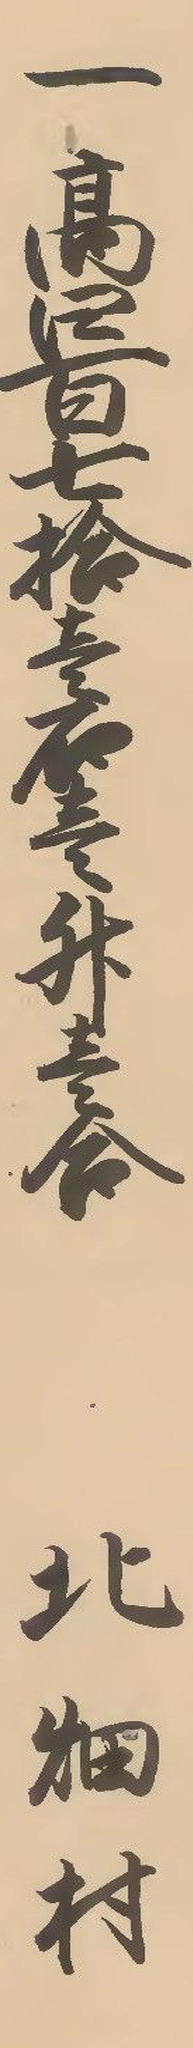一高四百七拾壱石壱升壱合北畑村
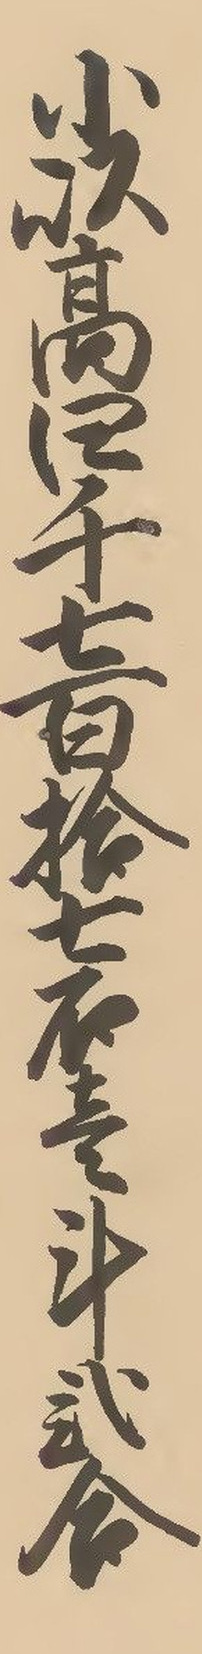小以高四千七百拾七石壱斗弐合

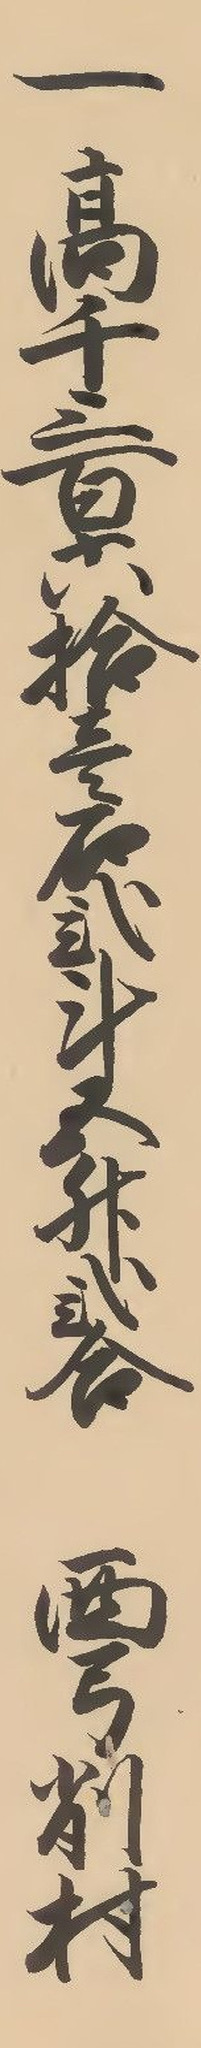一高千三百六拾壱石弐斗五升弐合西弓削村
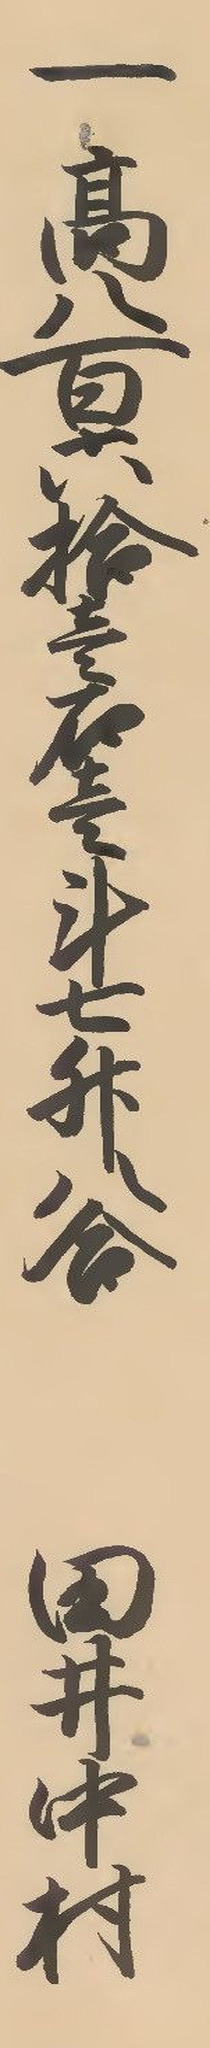一高八百六拾壱石壱斗七升八合田井中村
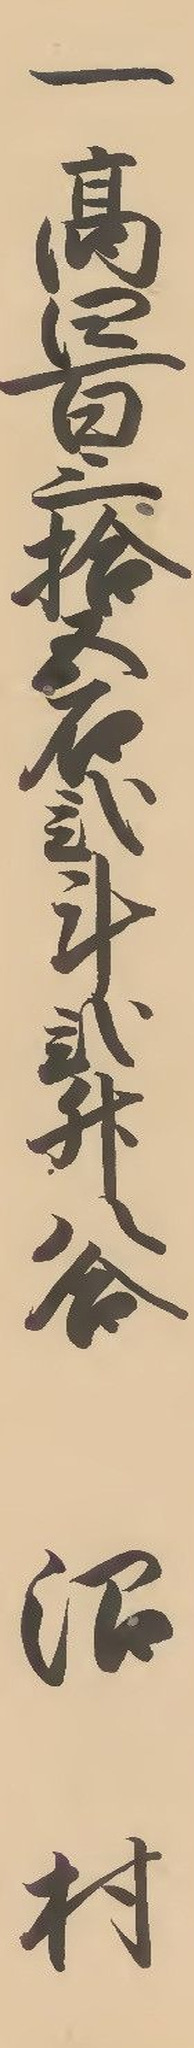一高四百三拾五石弐斗弐升八合沼村

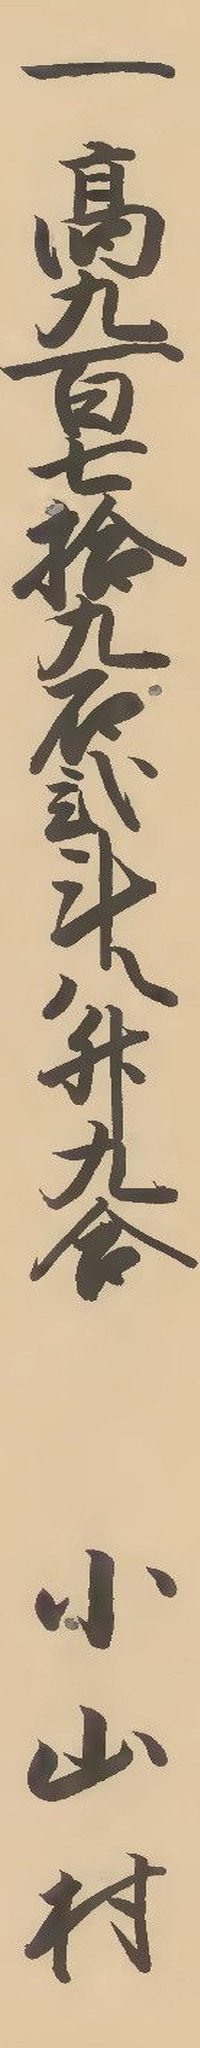一高九百七拾九石弐斗八升九合小山村
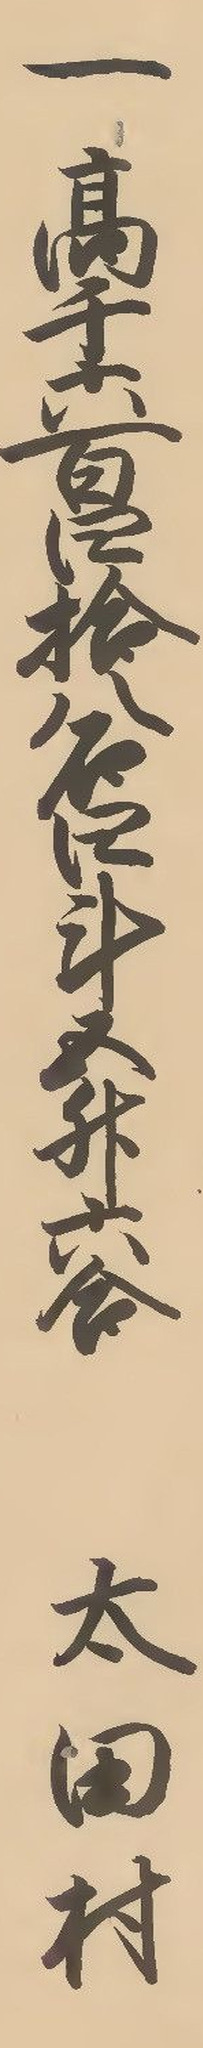一高千六百四拾八石四斗五升六合太田村
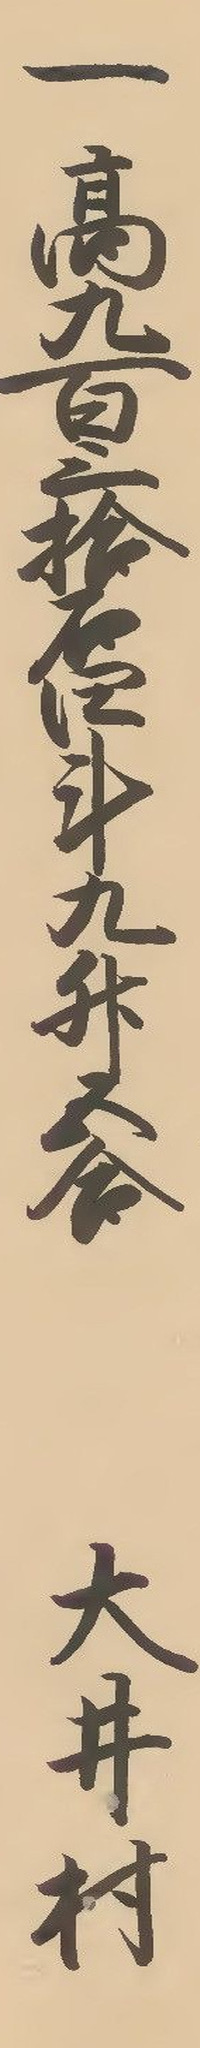一高九百三拾石四斗九升五合大井村
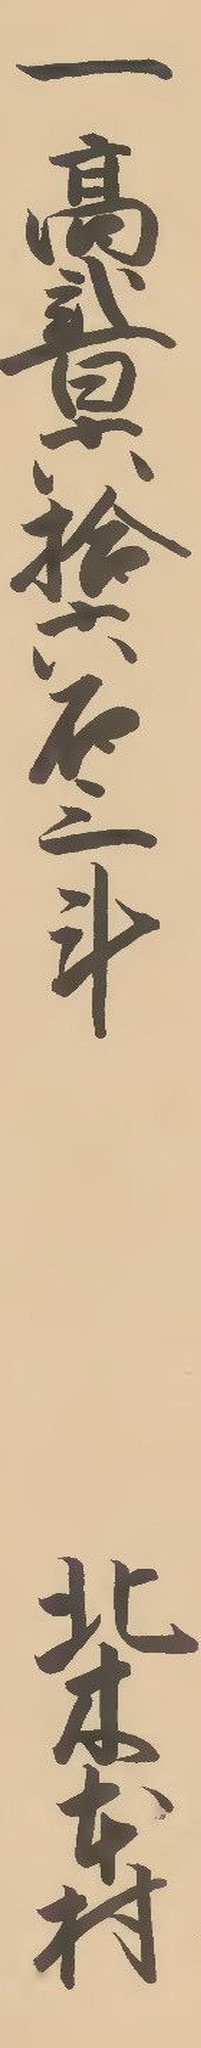一高弐百六拾六石三斗北木本村
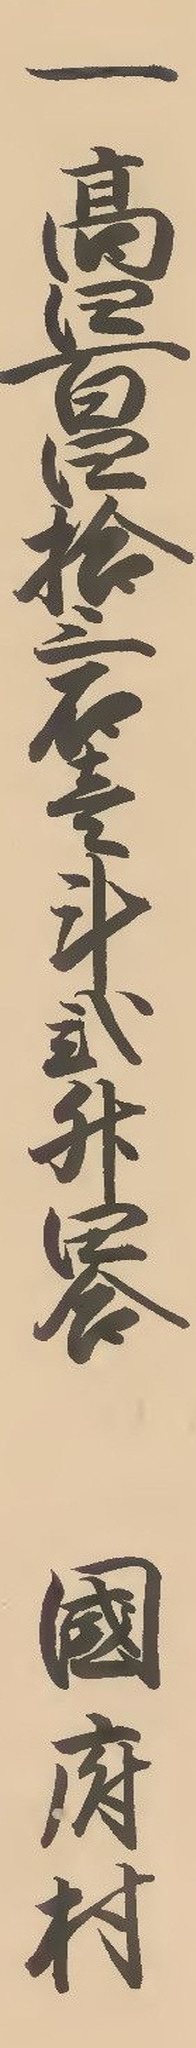一高四百四拾三石壱斗弐升四合国府村
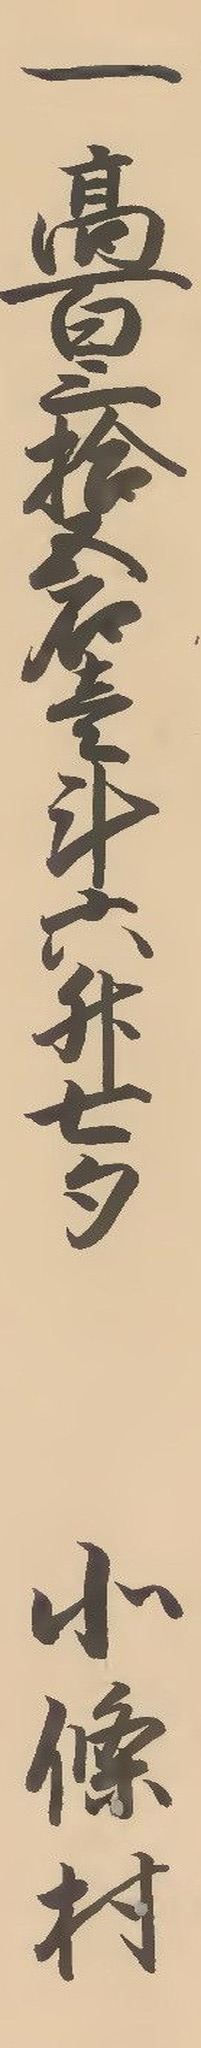一高百三拾五石壱斗六升七勺北条村
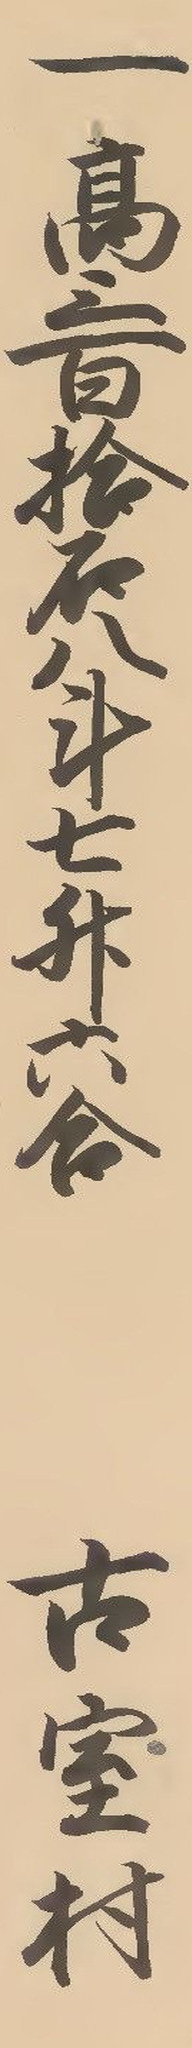一高三百拾石八斗七升六合古室村
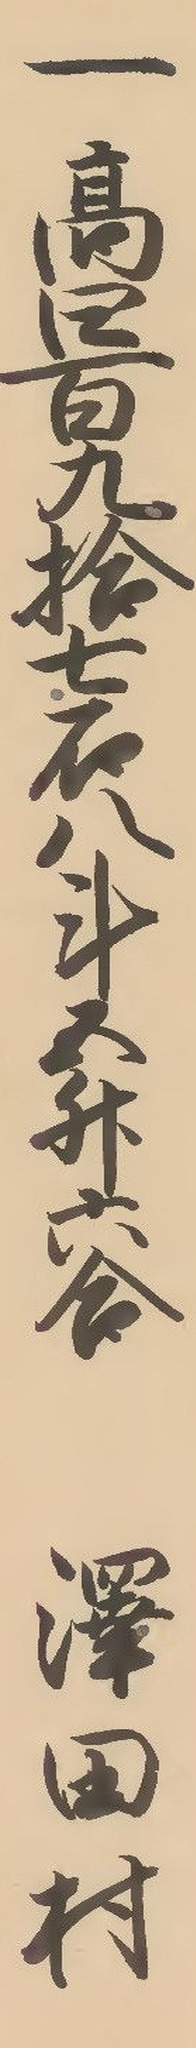一高四百九拾七石八斗五升六合沢田村

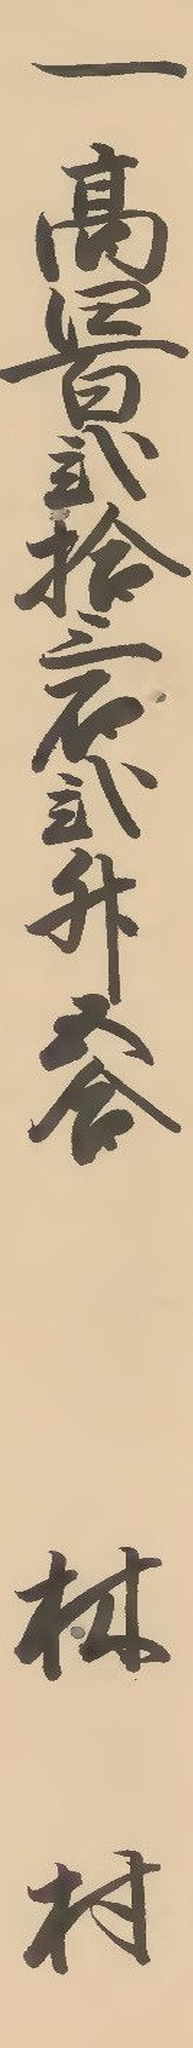一高四百弐拾三石弐升五合林村
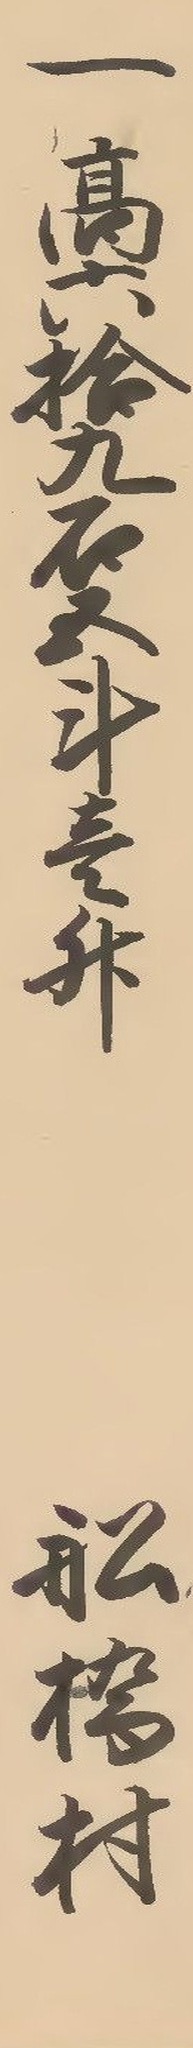一高六拾九石五斗壱升船橋村
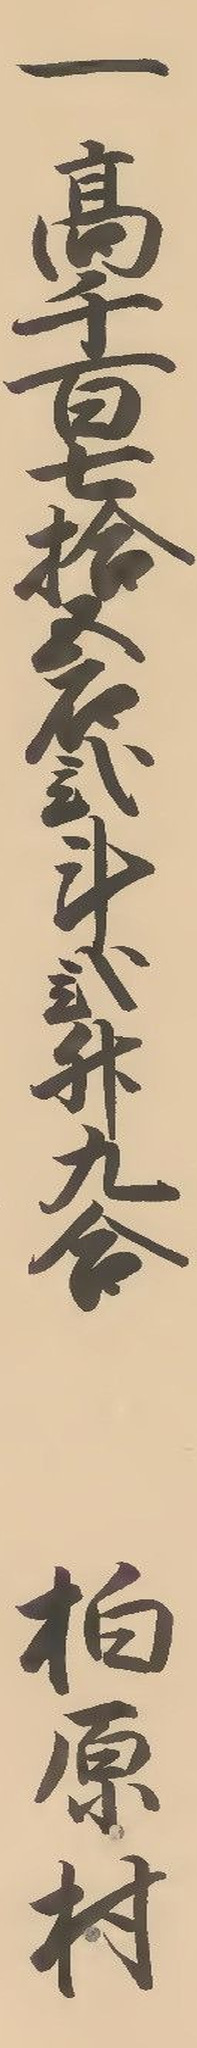一高千百七拾五石弐斗弐升九合柏原村
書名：河内国郷帳
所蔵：国立公文書館 National Archives of Japan
